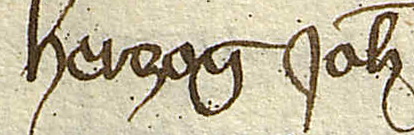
hercʒog Ioh*
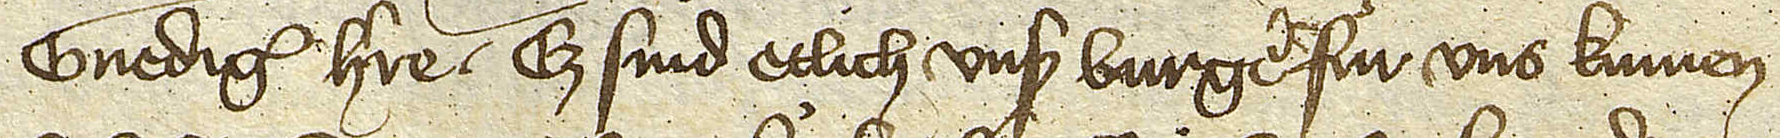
Gnedig* h*re / Eʒ ſind etlich vnſ* burge* für vns kumen
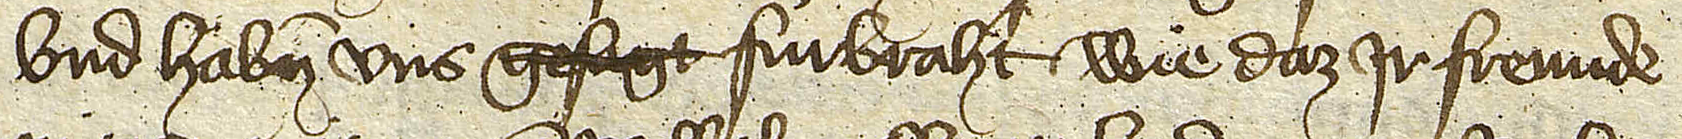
vnd habn* vns geſagt fürbraht / wie daʒ Ir freunde
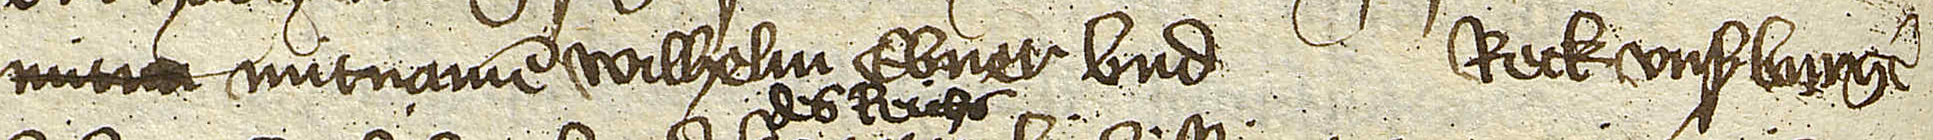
mitna mitname* wilhelm Ebner vnd Reck vnſ* burge*
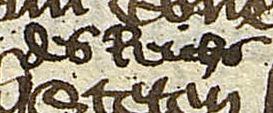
des Reichs
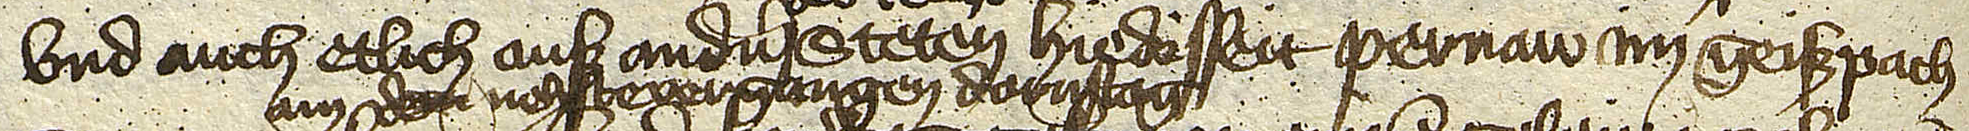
vnd auch etlich auſʒ andn* Steten hiediſſeit pernaw im geiſʒpach
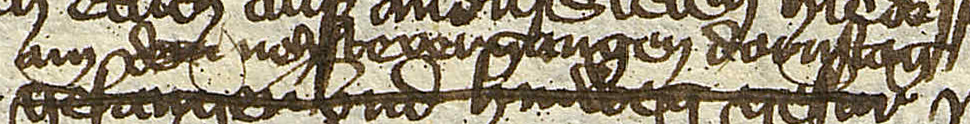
am dem nehſte vergangen dornſtag
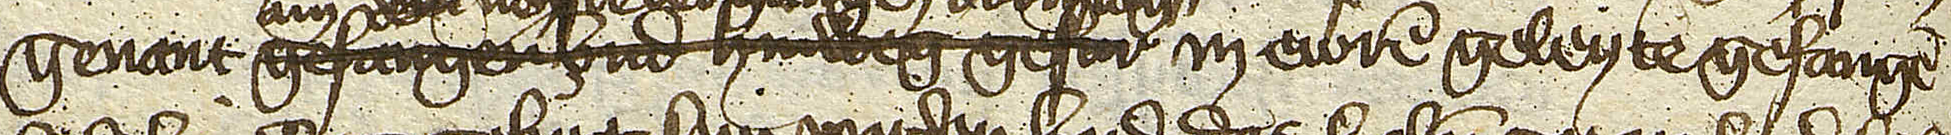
genant gefangen vnd hinweg gefur in ewre* geleyte gefange*
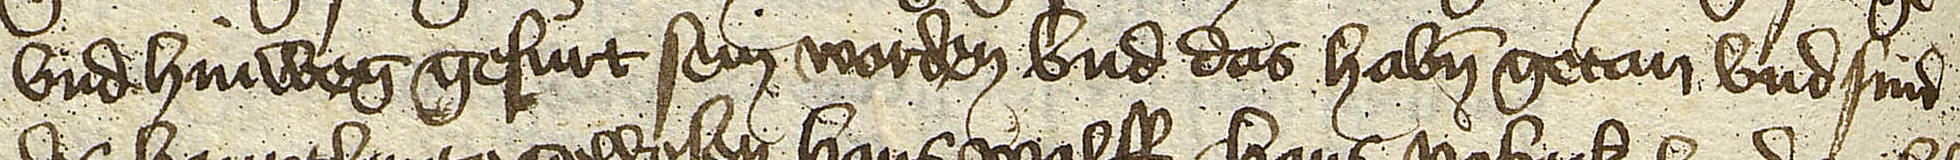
vnd hinweg gefürt ſein worden vnd das habn* getan vnd ſind
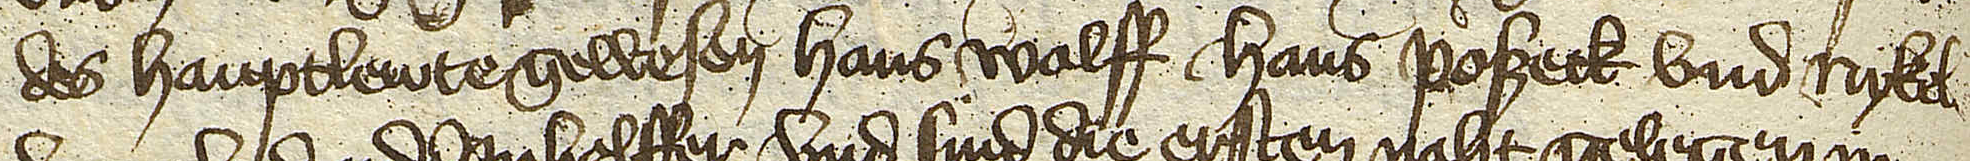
des hauptlewte geweſen hans wolff / hans poſʒeck vnd Nykel
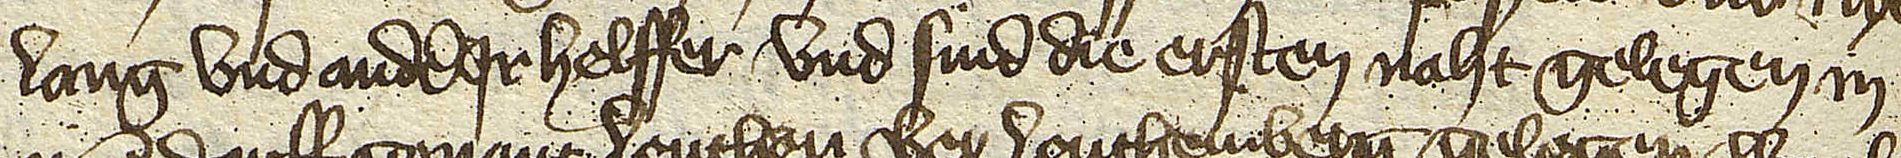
lang vnd ande* Ir helffer / vnd ſind die erſten naht gelegen in
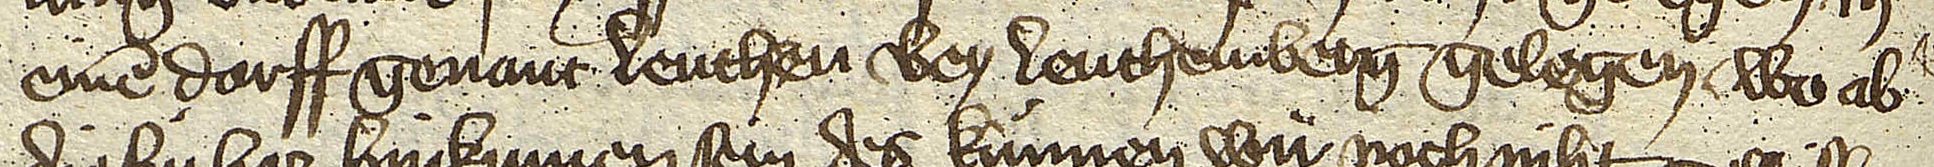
eine* dorff genant leuthen bey leuthenberg gelegen / wo ab*
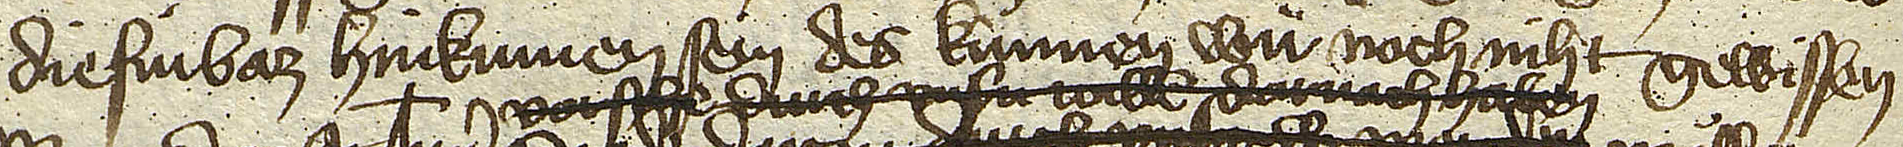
die fürbaʒ hinkumen ſein des künnen wir noch niht gewiſſen
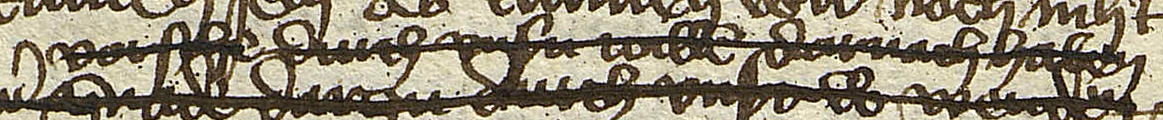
vorſche durch vnſ*n wille* darnach haben
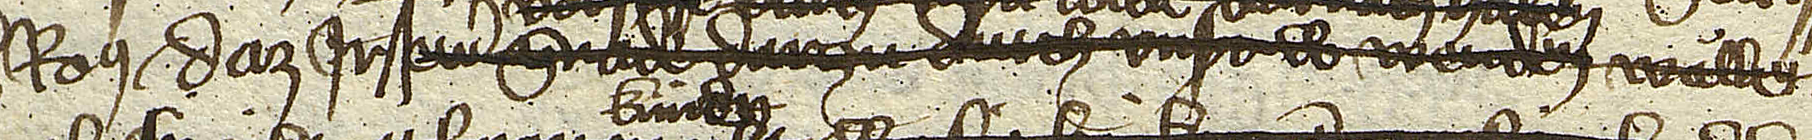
Ro* / daʒ Ir ew* gnade darcʒu durch vnſ*r w wenden wöllet
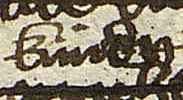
kündn*
